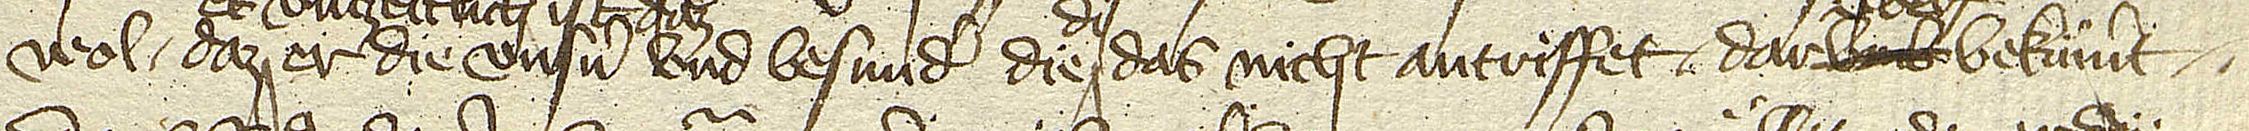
wol / daʒ er die vnſn* vnd beſund* die das nicht antriffet / darvmb bekümt* /
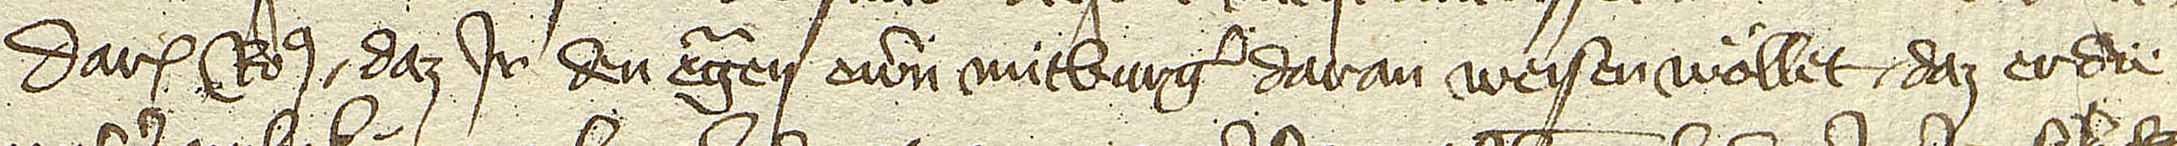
Dar* Ro* / daʒ Ir den egen* ew*n mitburg* daran weiſen wöllet / daʒ er die
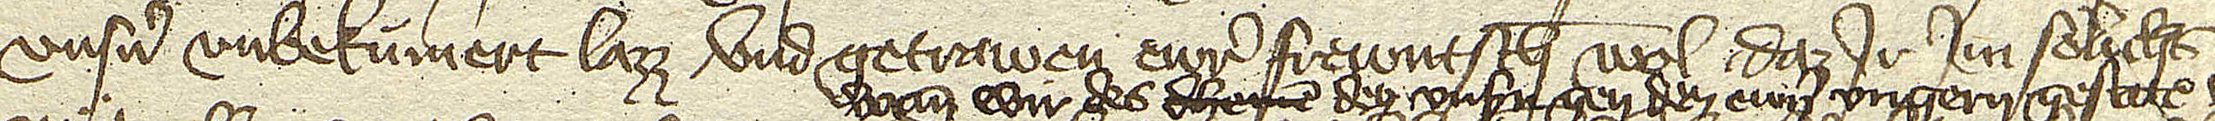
vnſn* vnbekümert laʒʒ / vnd getrawen ewr* frewntſch* wol / daʒ Ir Im ſölichs
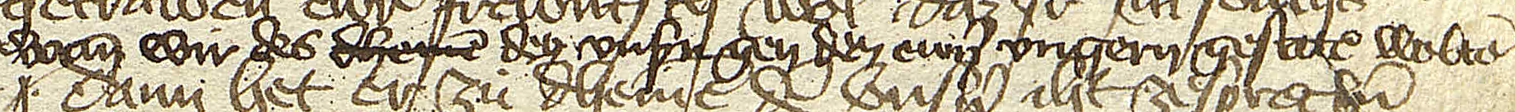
wan wir des dheine* den vnſ*n gen den ewn* vngern geſtate* wolte*
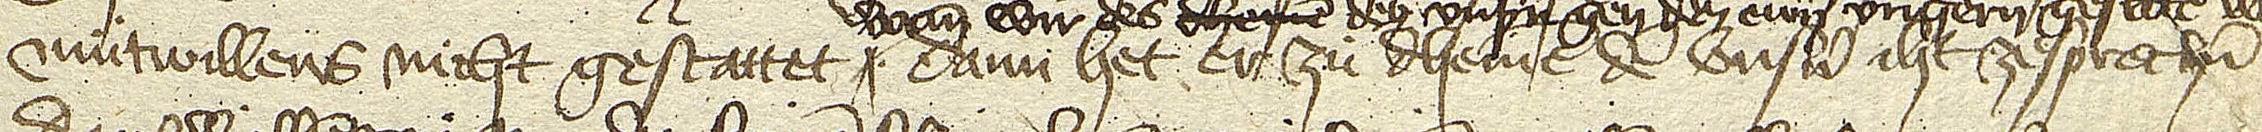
mütwillens nicht geſtattet / . Dann het er cʒü dheine* d* vnſn* iht cʒeſprechn*
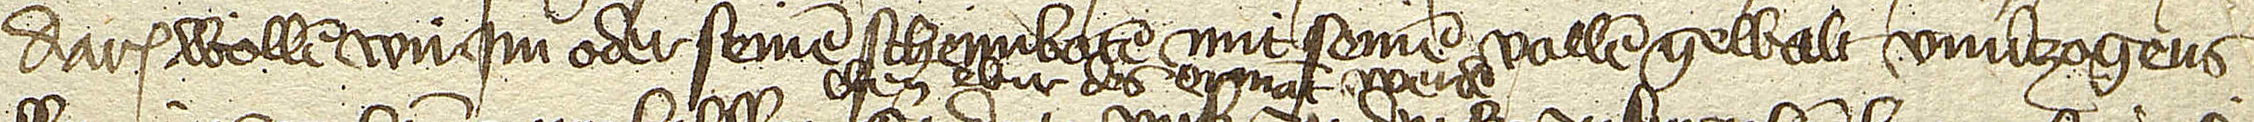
dar* wölle* wir Im oder ſeine* ſcheimbote* mit ſeine* volle* gewalt vnu*cʒogens
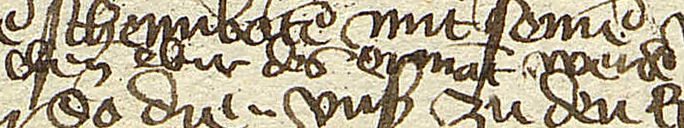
wen* wir des ermat* werde*
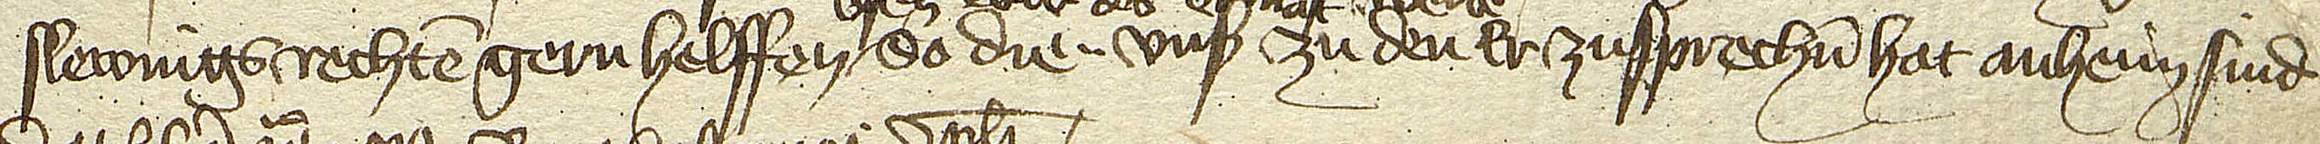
ſlewnigs rechte* gern helffen / So die ~ vnſ* cʒu den Er cʒuſprechn* hat anheim ſind
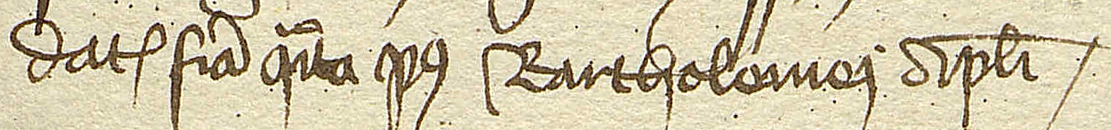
dat* fia* qrta* p* Bartholomei Apli* /
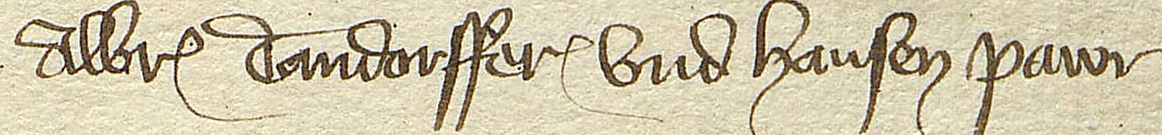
Albr* Tandorffer* vnd hanſen Pawr
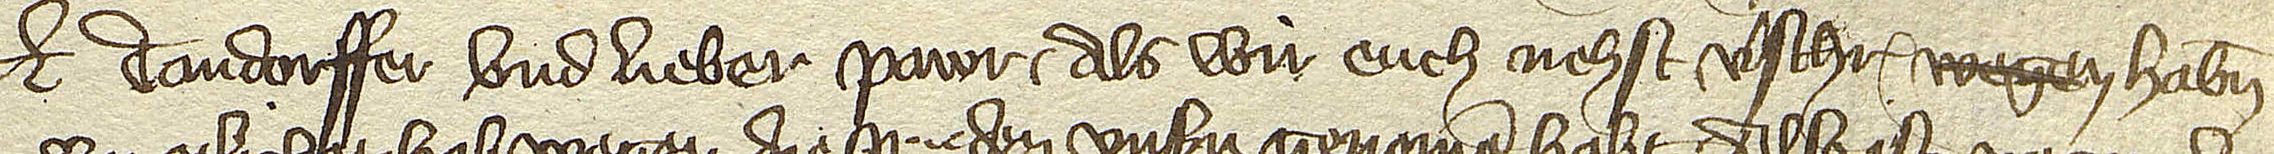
L* Tandorffer vnd lieber Pawr / Als wir euch nehſt v*ſchr* wegen habn*
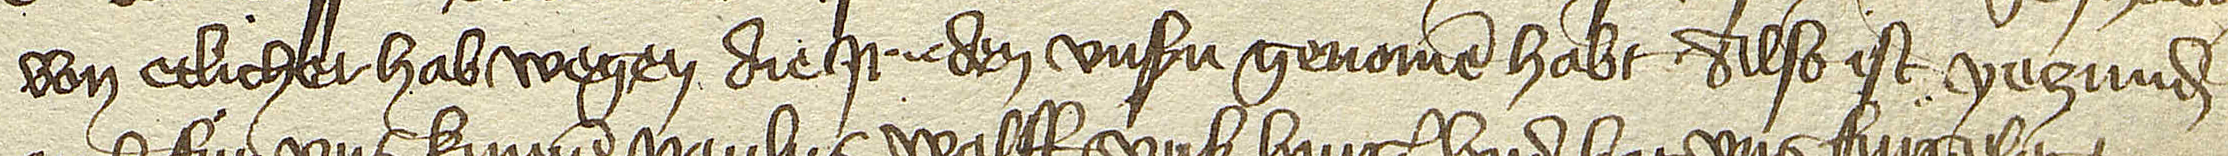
von etlicher hab wegen die Ir ~ den vnſ*n genome* habt / Alſo iſt yecʒund*
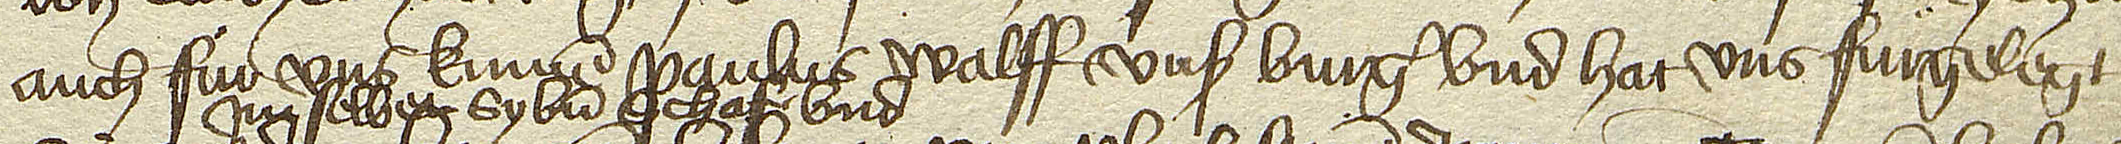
auch für vns kume* Paulus wolff vnſ* burg* vnd hat vns fürgelegt
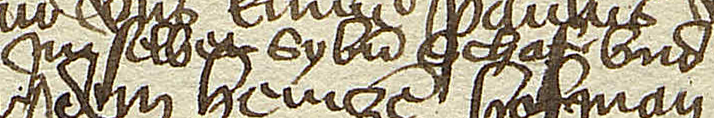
Im ſelber Sybn* Schaf vnd
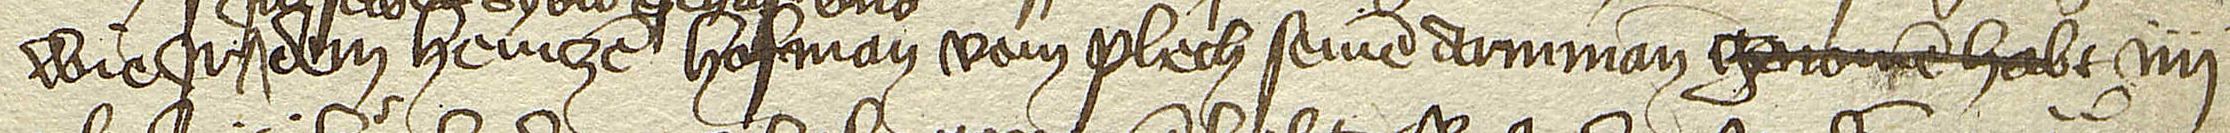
wie Ir dem heincʒe* hofman von Plech ſeine* Armman genome* habt iiii
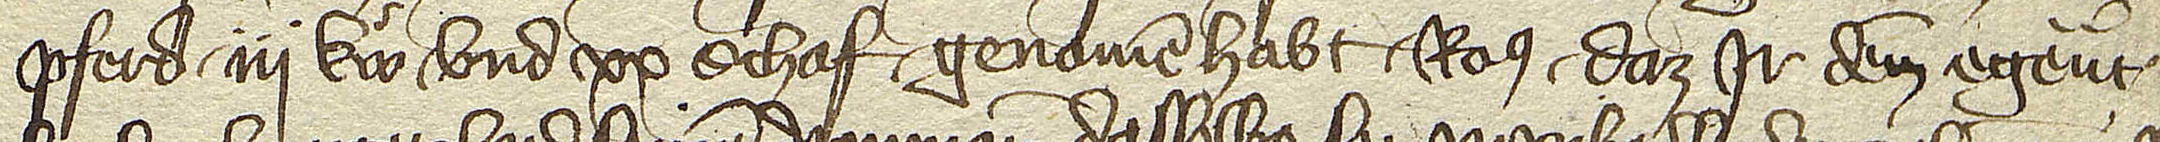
pferd / iii kw / vnd xx Schaf / genome* habt / Ro* / daʒ Ir dem egen*t*
